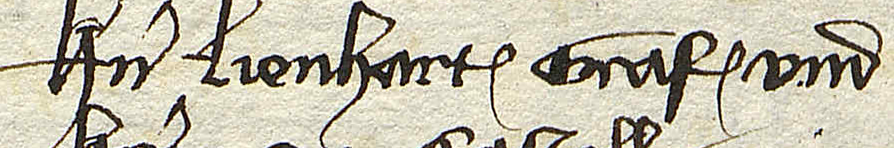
Hn* Lienhart* Graf* vnd
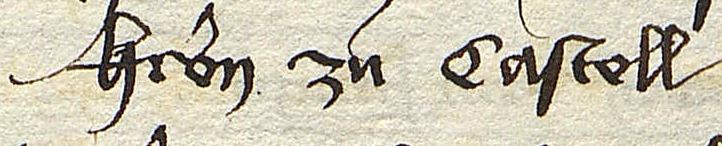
hren* ʒu Caſtell
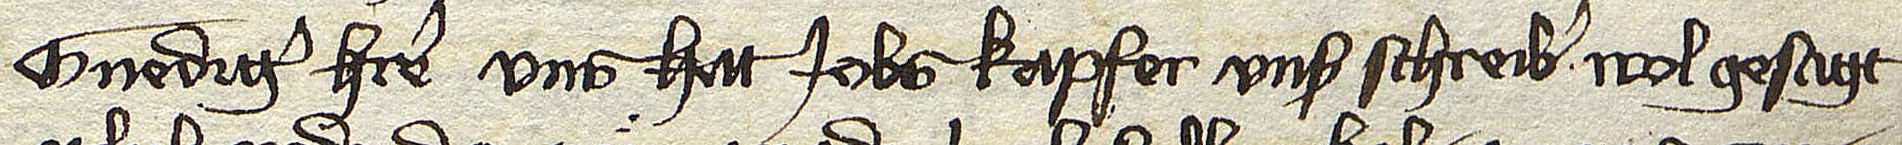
Gnedig* hre* vns hat Iobs kapfer vnſ* ſchreib* wol geſagt
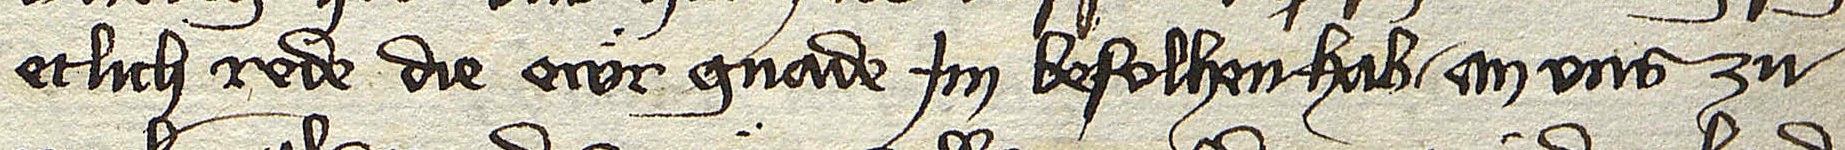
etlich rede die eẅr gnade Im befolhen hab* an vns ʒu
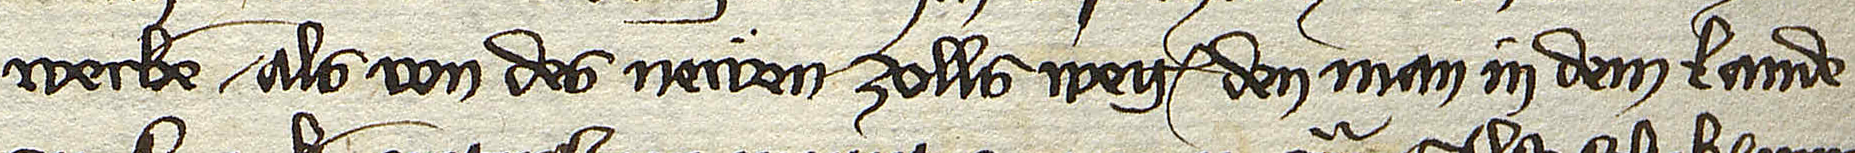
werbe* / als von des neẅen ʒolls weg* den man in dem lande
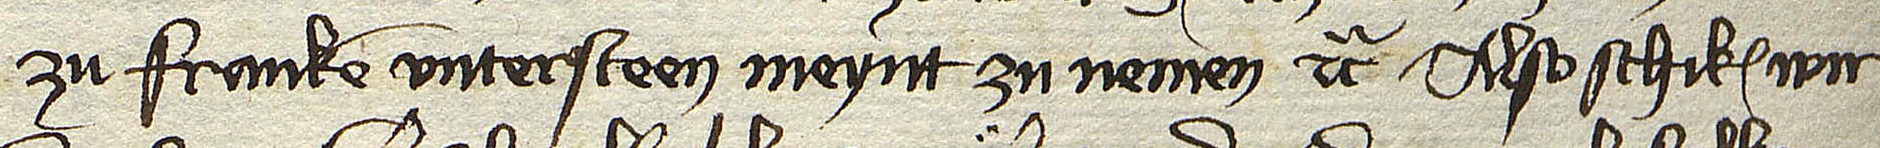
ʒu franke* vnterſteen meynt ʒu nemen ec* / Alſo ſchik* wir
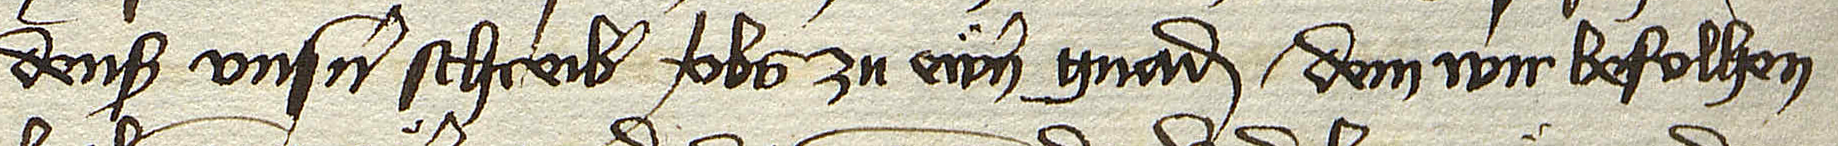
denſ* vnſ*n ſchreib* Iobs ʒu eẅ*n gnad* / dem wir beſolhen
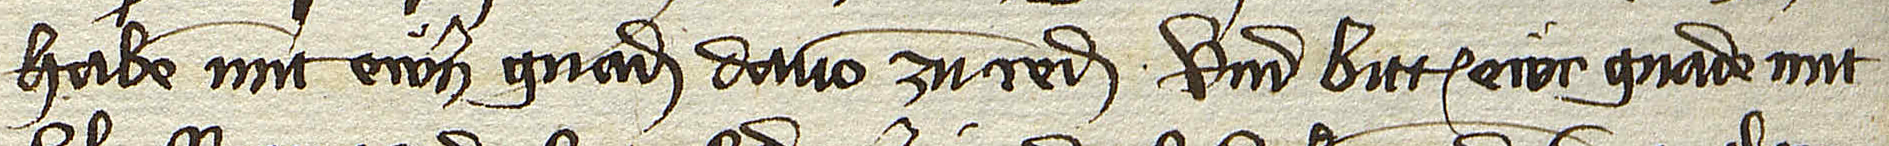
habe* mit eẅ*n gnad* dauo* ʒured* . Vnd bitt* eẅr gnade mit
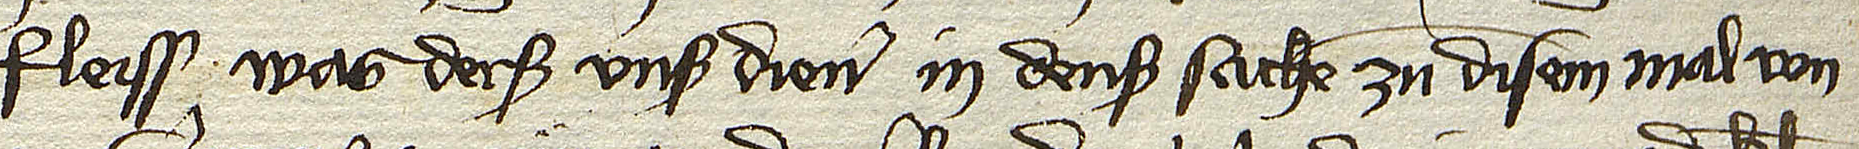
fleiſſ . was derſ* vnſ* dien* in denſ* ſache* ʒu diſem mal von
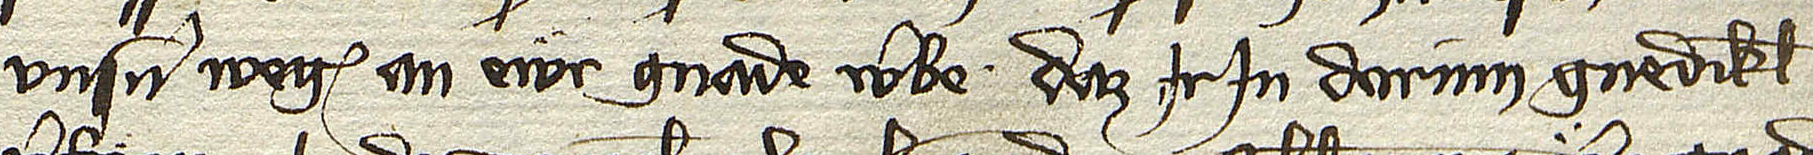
vnſ*n weg* an eẅr gnade w*be . daʒ Ir In darinn gnedikl*
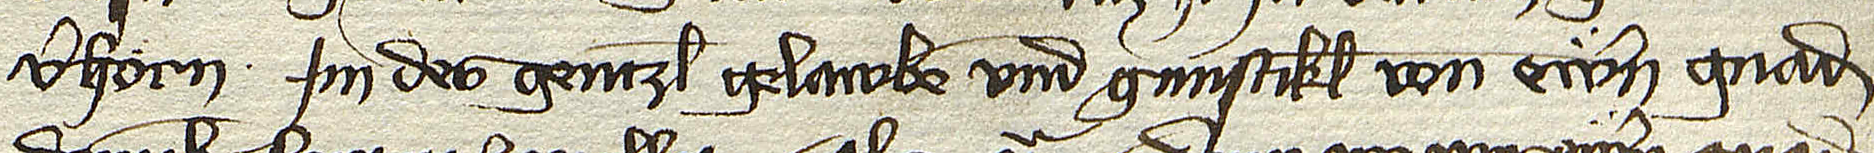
v*hörn . Im des gencʒl* gelawbe* vnd gunſtikl* von eẅ*n gnad*
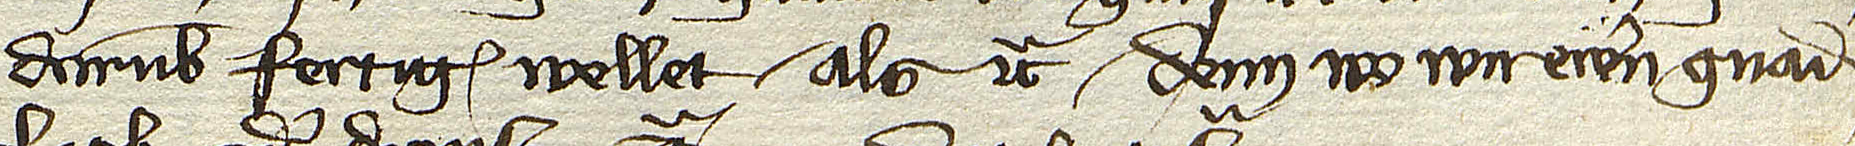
darub* fertig* wellet / als ec* / denn wo wir eẅ*n gnad*
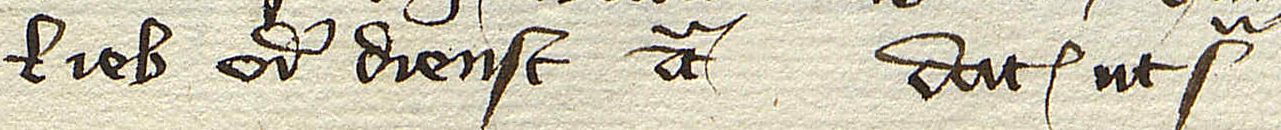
lieb od* dienst ec* dat* ut ſ*
